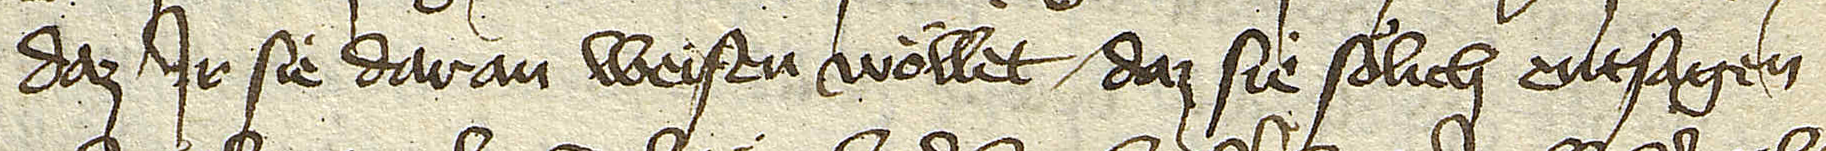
daʒ Ir ſie daran weiſen wöllet / daʒ ſie ſölich entſagen
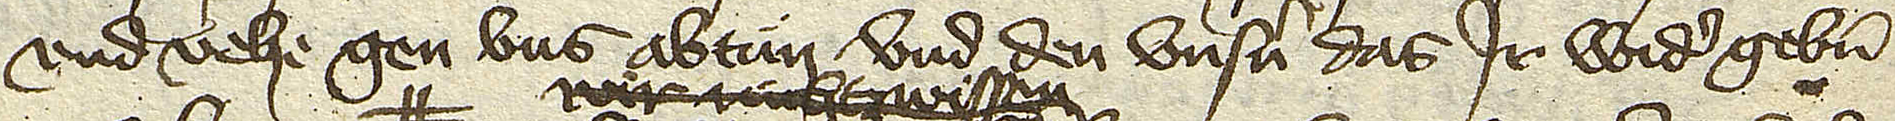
vnd vehe gen vns abtün / vnd den vnſn* das Ir wid* gebn*
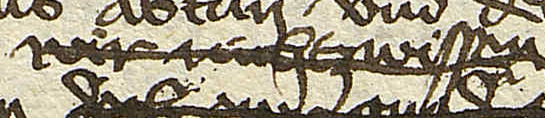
wir nichtʒ wiſſen
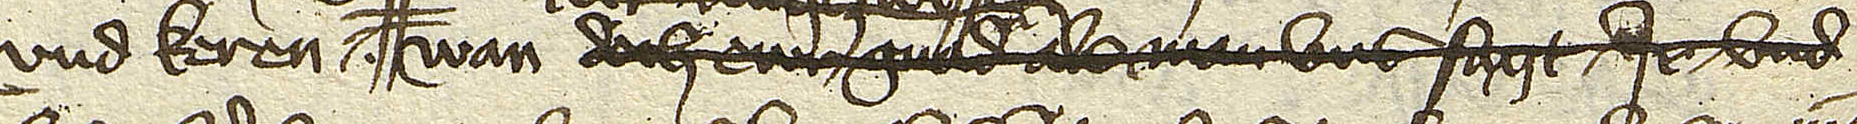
vnd keren / . wan doch ewr gnad als man vns ſagt / Ir / vnd
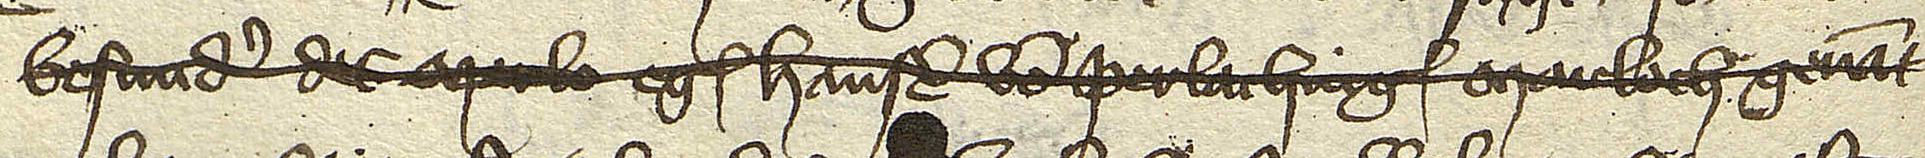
beſund* des Marlo eg* Hanſe* vo* Perlaching* Marloch genat*
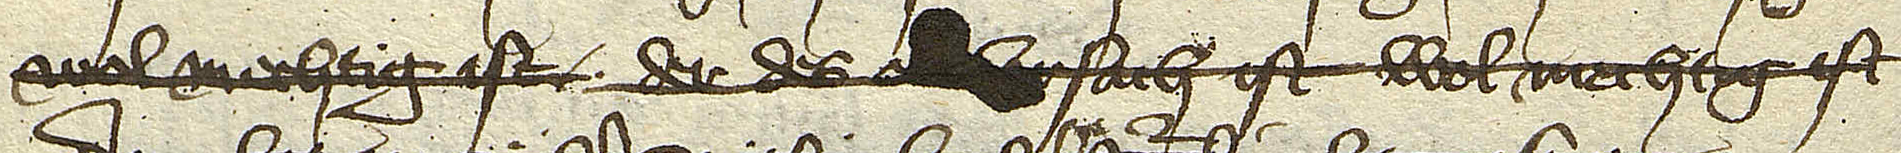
wol mechtig iſt / . der des %% %%% ſach iſt wol mechtig iſt
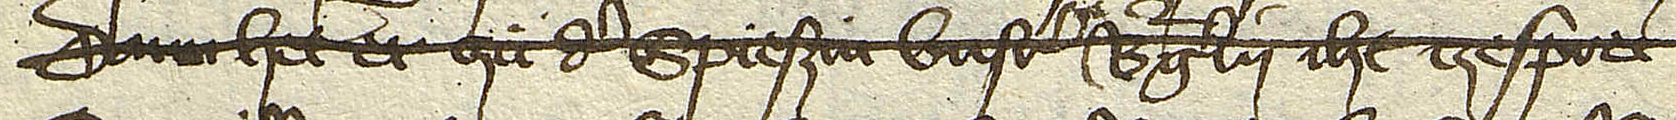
Dauor het er cʒü d* Spieſʒin vnſr* B*g*in iht cʒeſprec
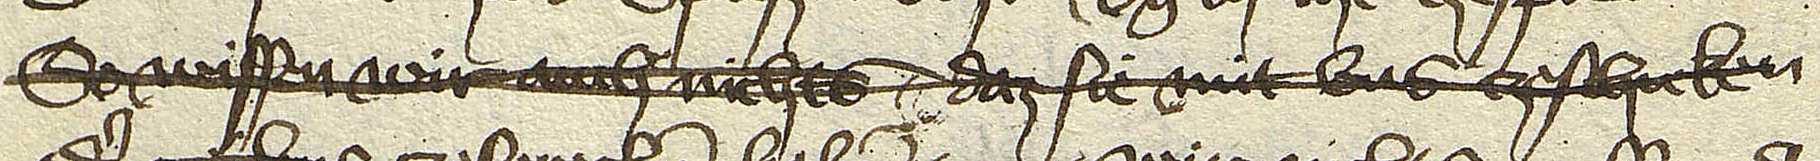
So wiſſen wir auch nichts / daʒ ſie mit vns cʒeſchicken
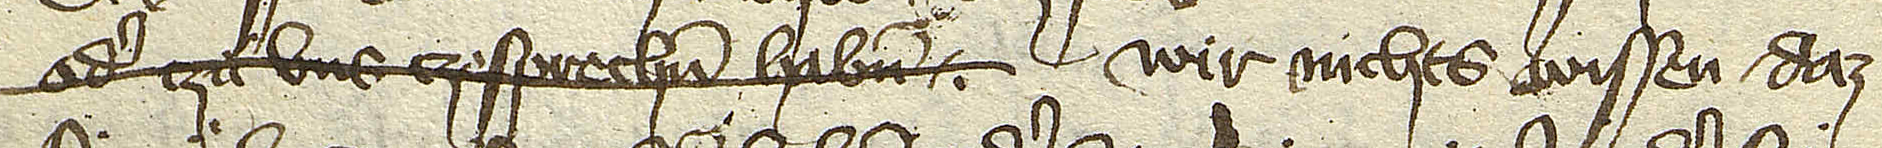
od* cʒü vns cʒeſprechn* habn* / . wir nichts wiſſen / daʒ
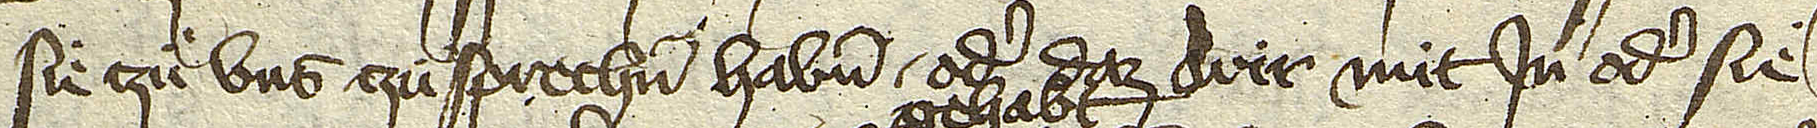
ſie cʒü vns cʒüſprechn* habn* / od* daʒ wir mit In od* ſie
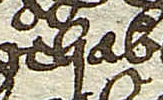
gehabt
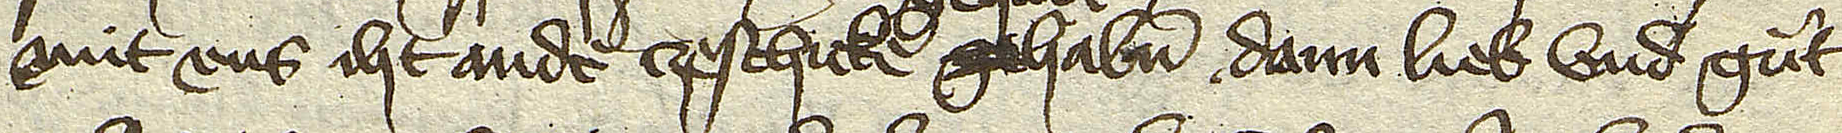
mit vns iht ands* cʒeſchicke* gehabn* dann lieb vnd güt
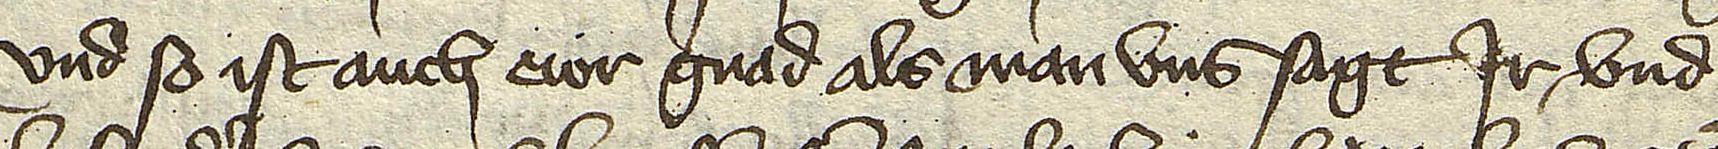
vnd ſo iſt auch ewr gnad als man vns ſagt Ir / vnd
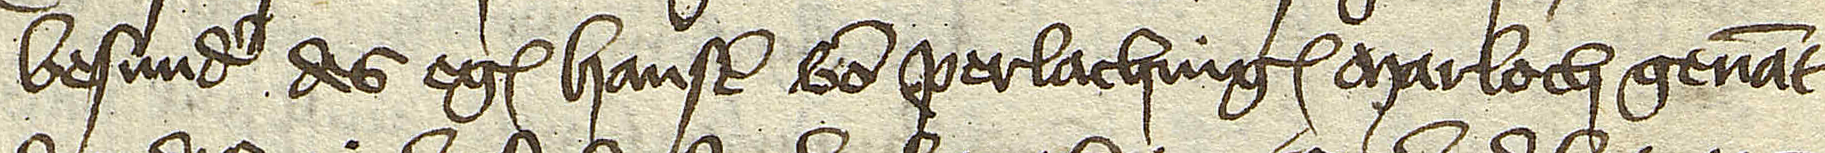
beſund* des eg* hanſe* vo* Perlaching* Marloch genat*
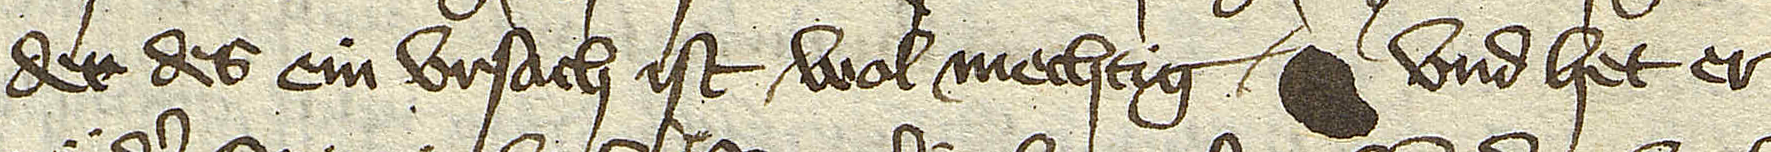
der des ein vrſach iſt / wol mechtig vnd het er
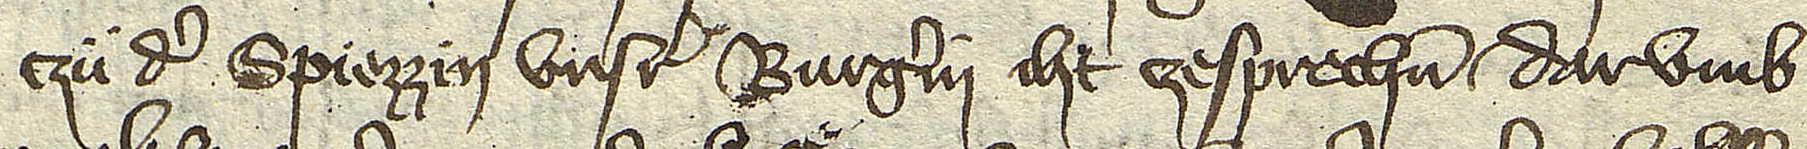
cʒü d* Spieʒʒin vnſr* Burg*in iht cʒeſprechn* / darvmb
